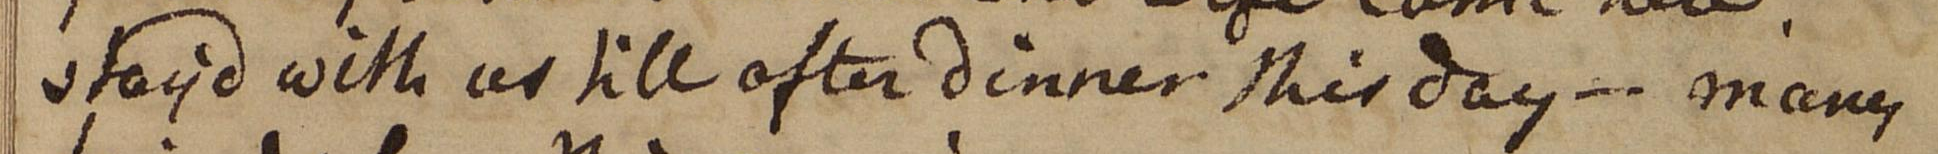stay'd with us till after dinner this day- many
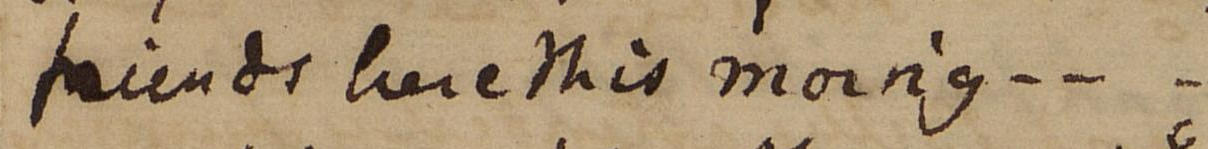friends here this morn'g--
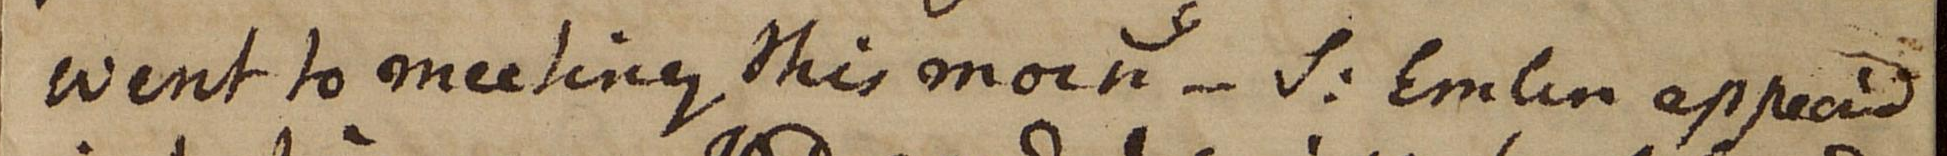went to meeting this morn^g- S: Emlen appear'd
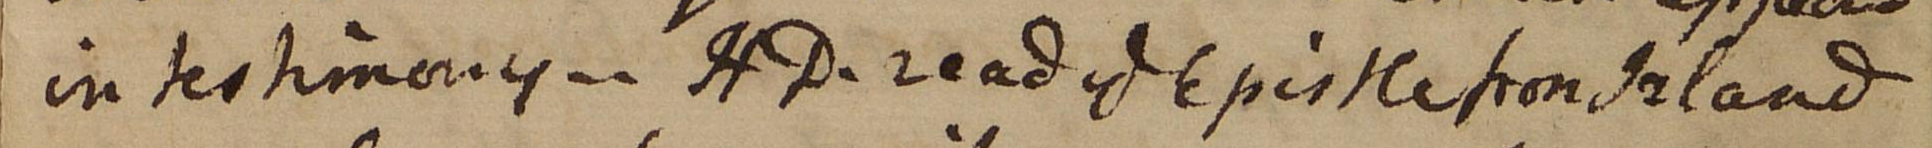in testimony- HD. read y^e Epistle from Island
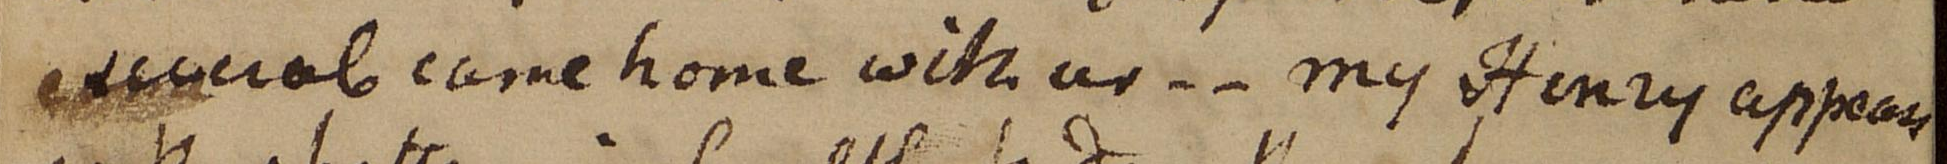several came home with us-- my Henry appears
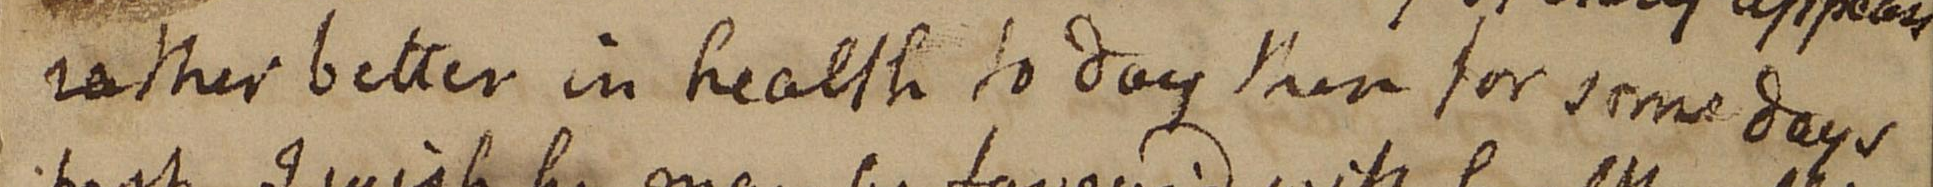rather better in health to day then for some days
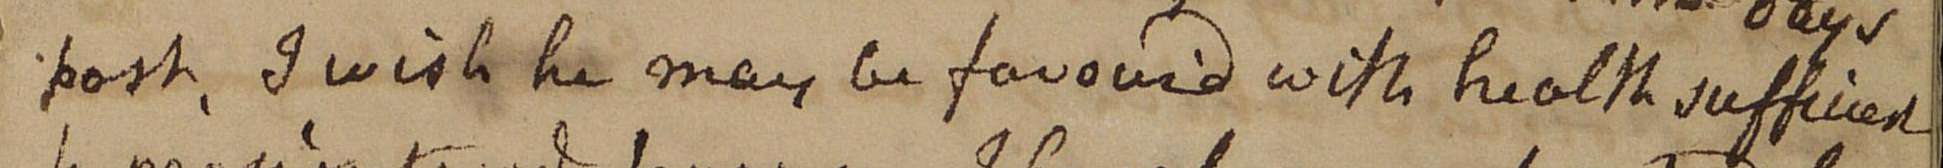past, I wish he may be favour'd with health sufficient
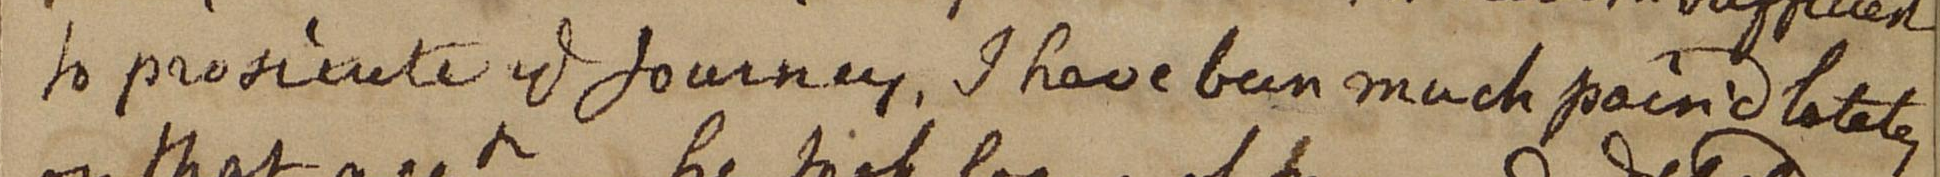to prosicute y^e Journey, I have been much pain'd lately
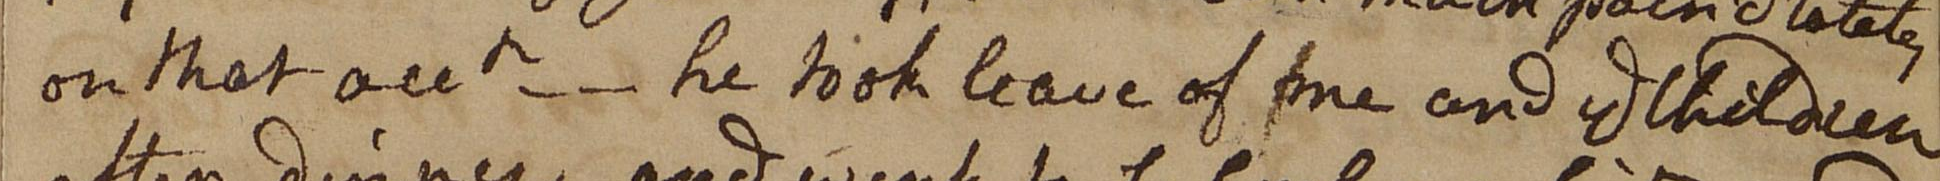on that acc^t.- he took leave of me and y^e Children
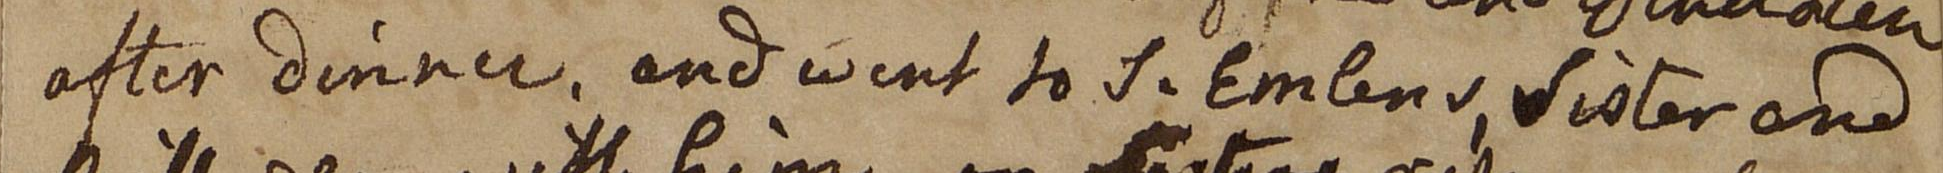after dinner, and went to S. Emlens, Sister and
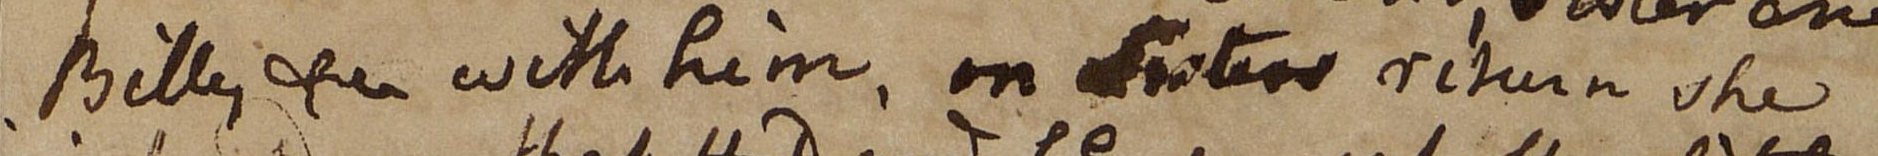Billy be with him, on Sisters return she
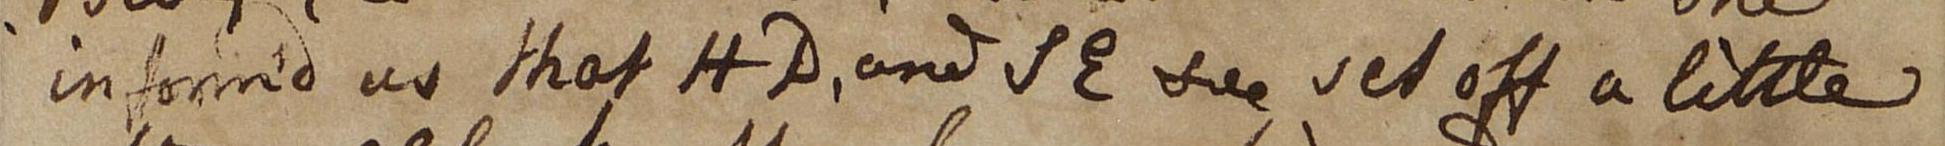inform'd us that HD, and SE &c set off a little
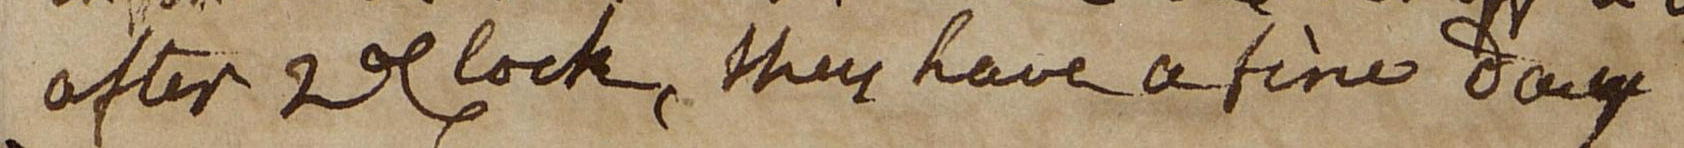after 2 ^oClock, they have a fine day
